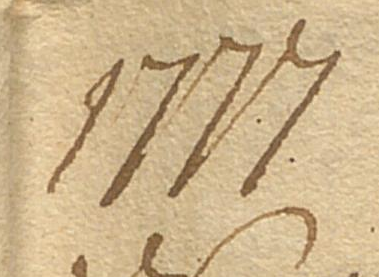1777
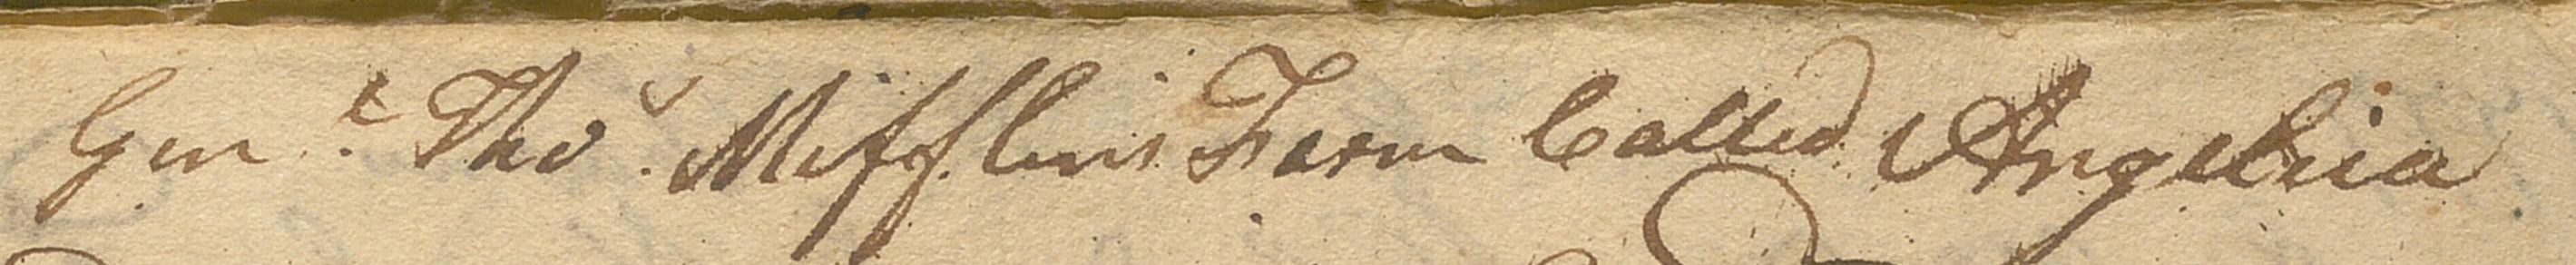Gen^l. Tho^s. Mifflins Farm Called Angelica
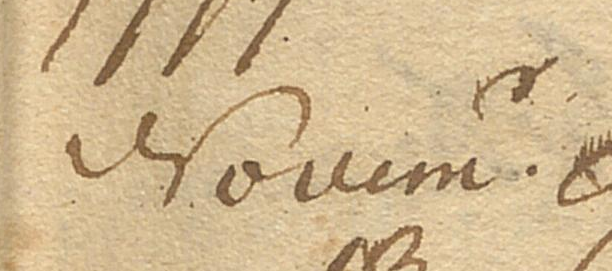Novem^r. of
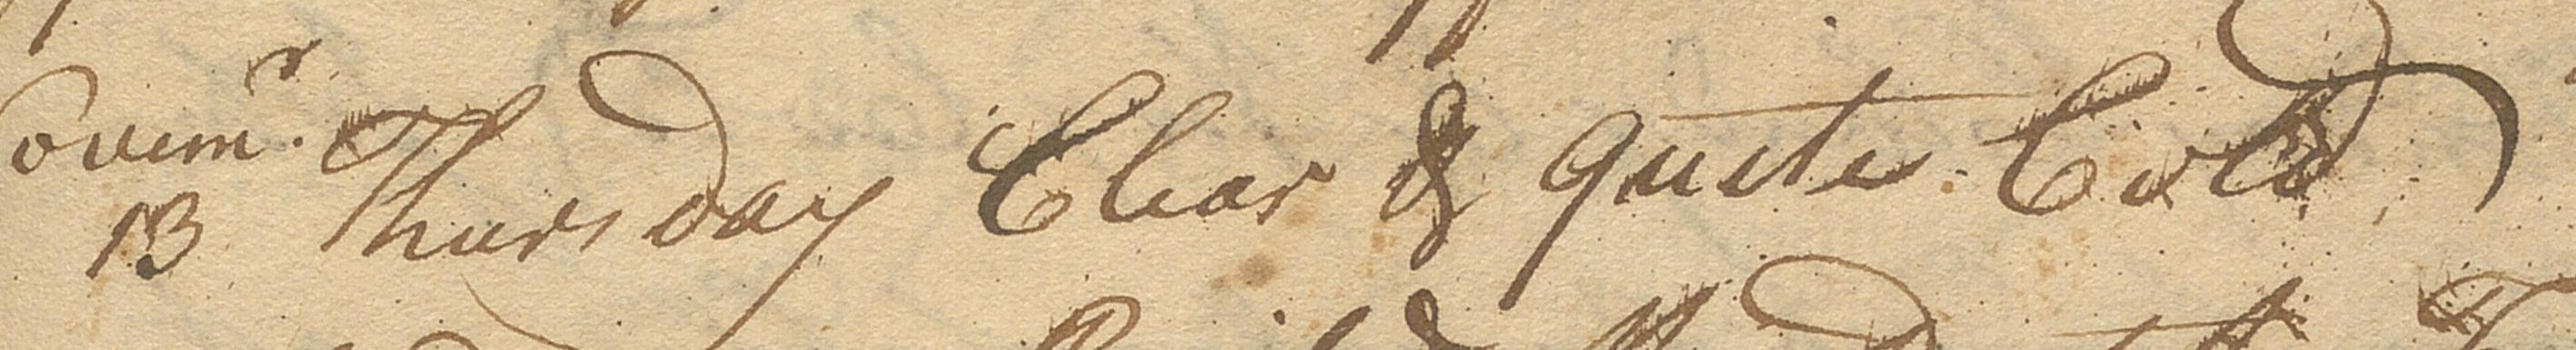13 Thursday Clear & quite Cold
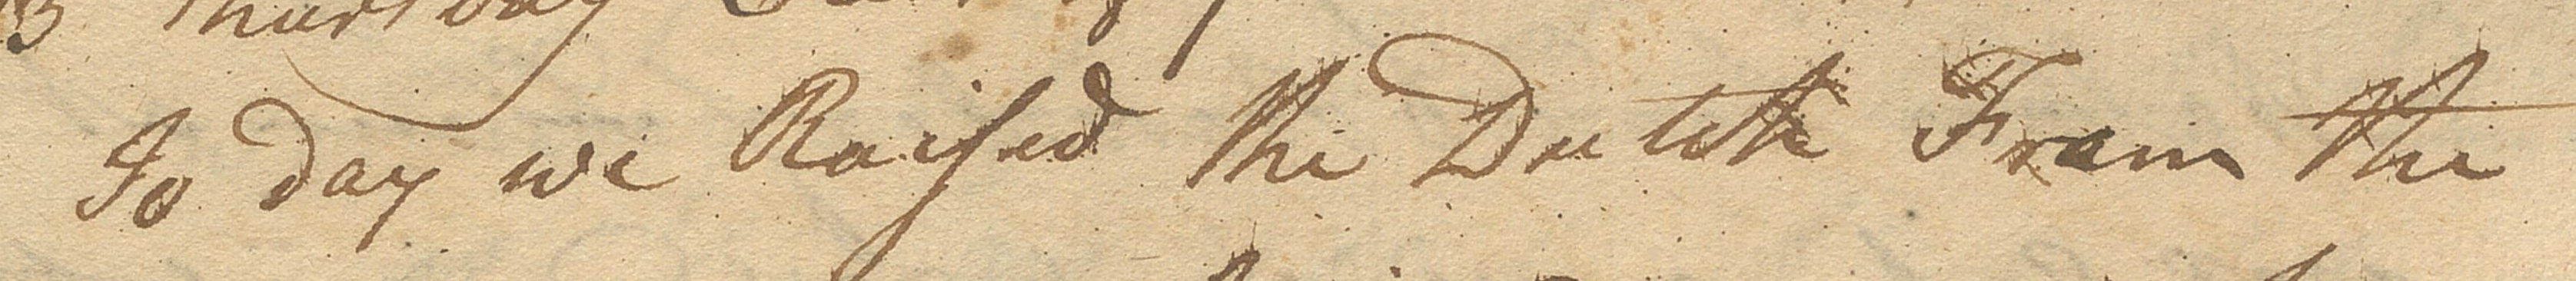To day we Raised the Dutch Fram the
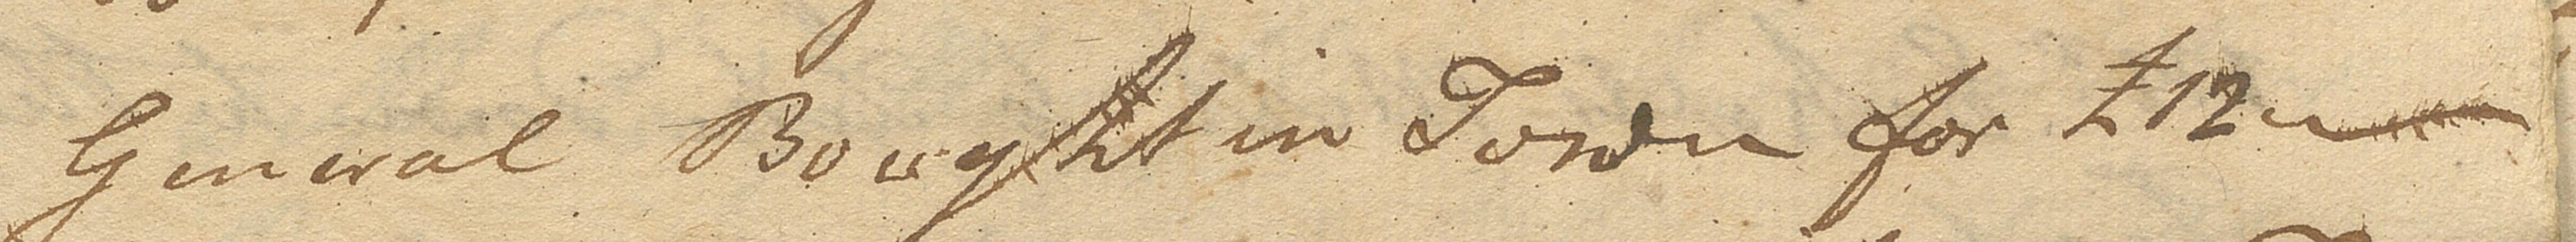General Bought in Town for £12-
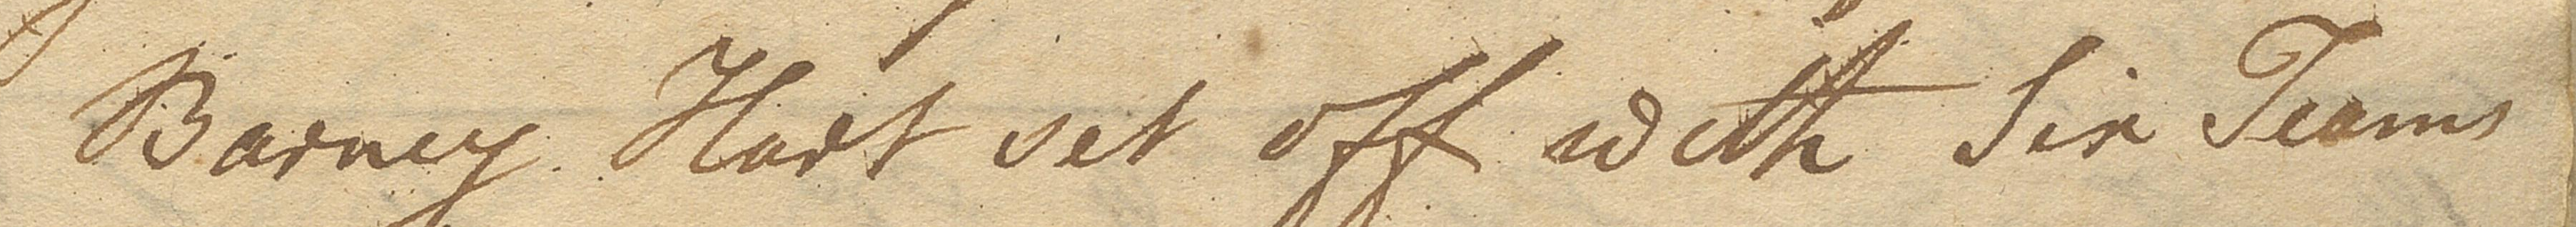Barney Hart set off with Six Teams
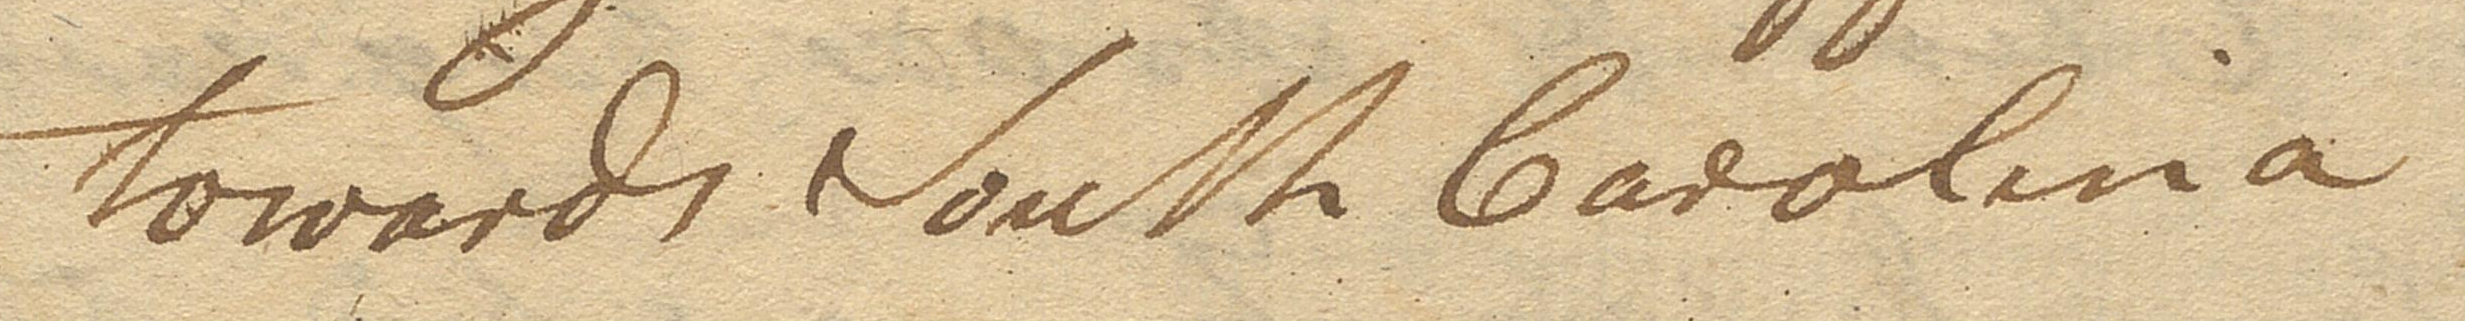towards South Carolina
